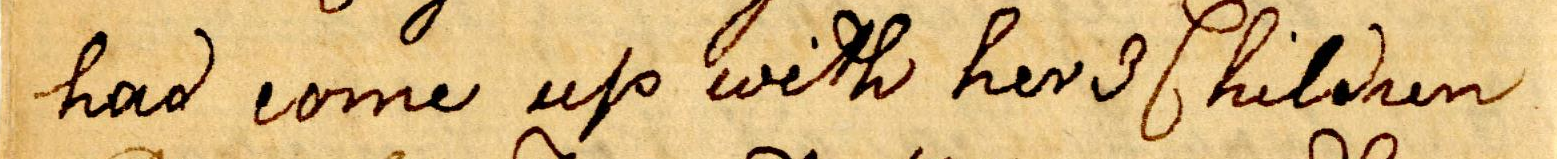had come up with her 3 Children
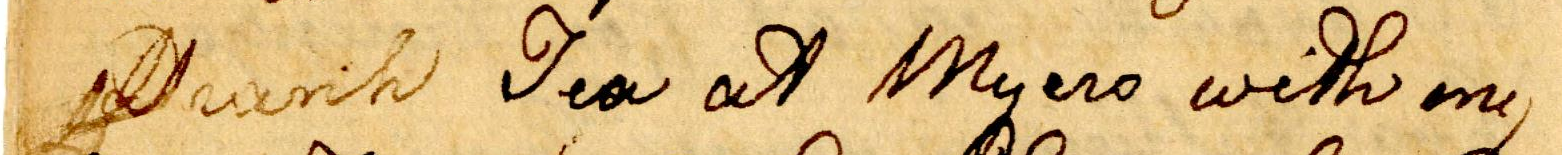Drank Tea at Myers with my
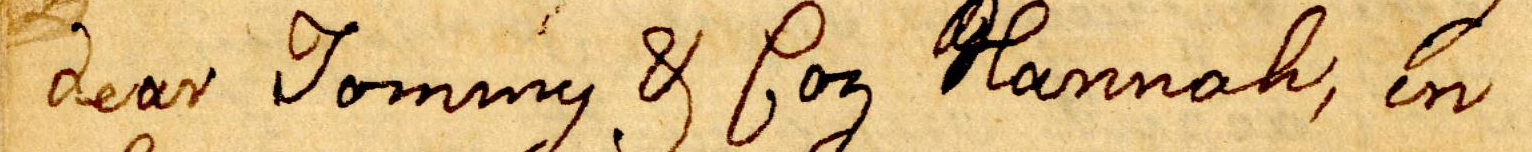dear Tommy & Coz Hannah, in
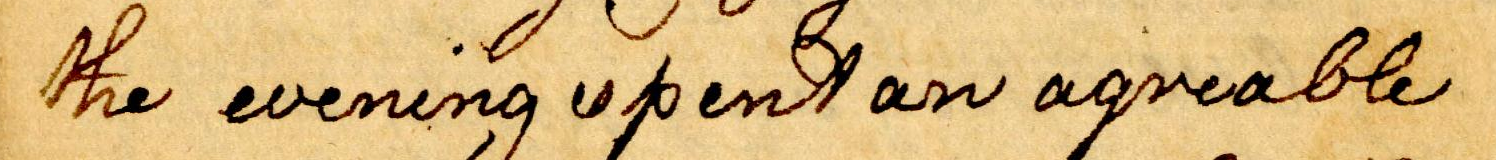the evening spent an agreable
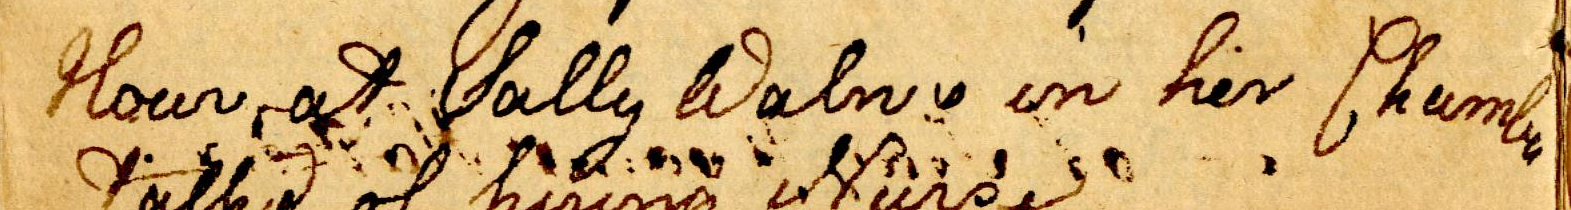Hour, at Sally Walns in her Chambe
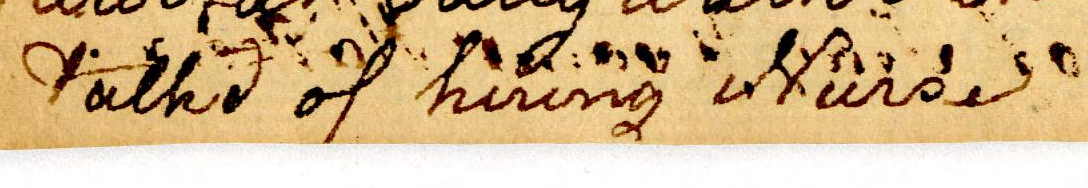talkd of hiring Nurse
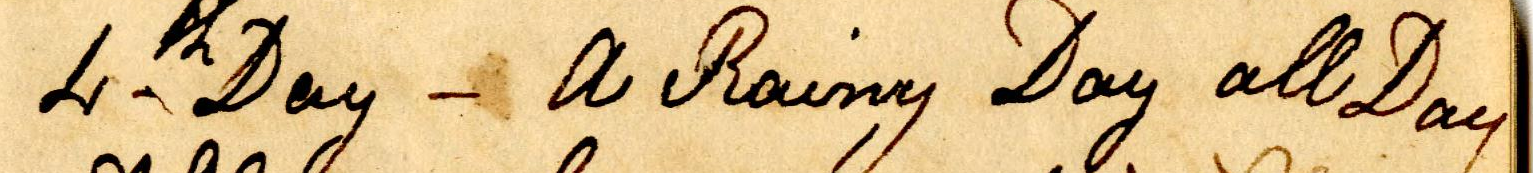4^th Day- A Rainy Day all Day
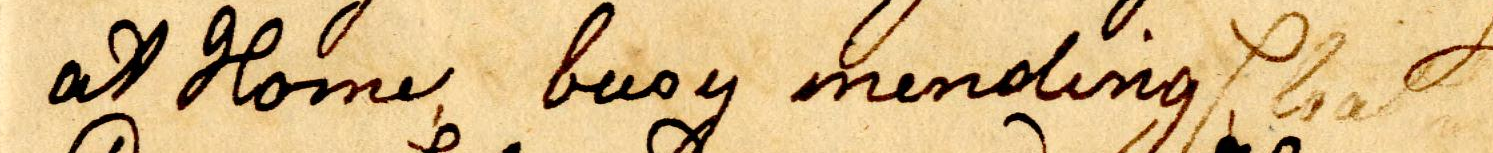at Home, busy mending [Cloak]
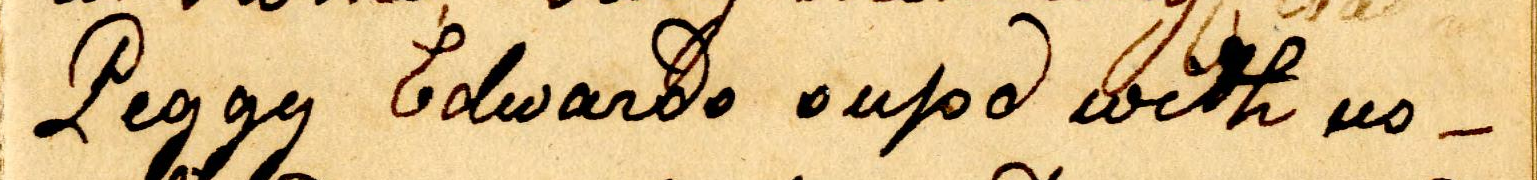Peggy Edwards supd with us-
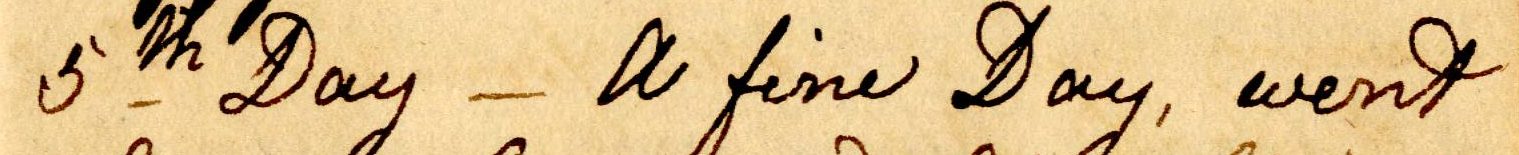5^th Day- A fine Day, went
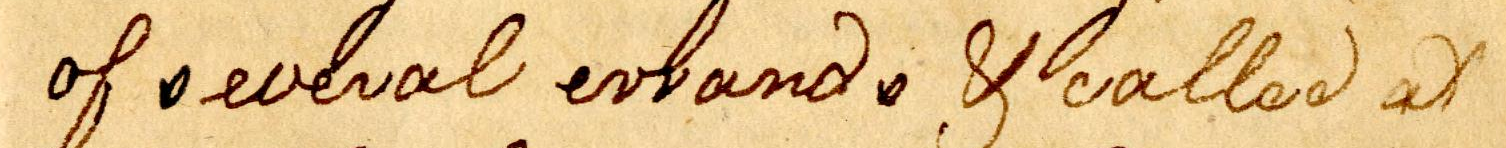of several errands & called at
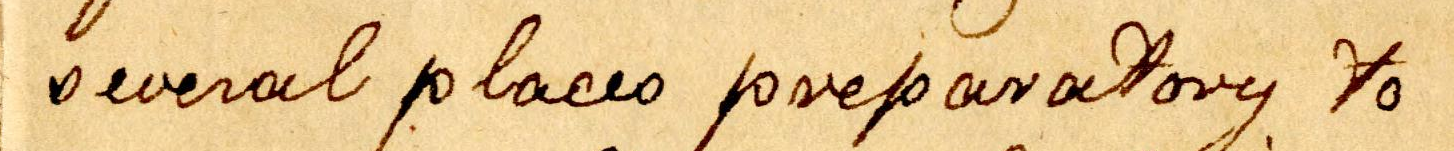several places preparatory to
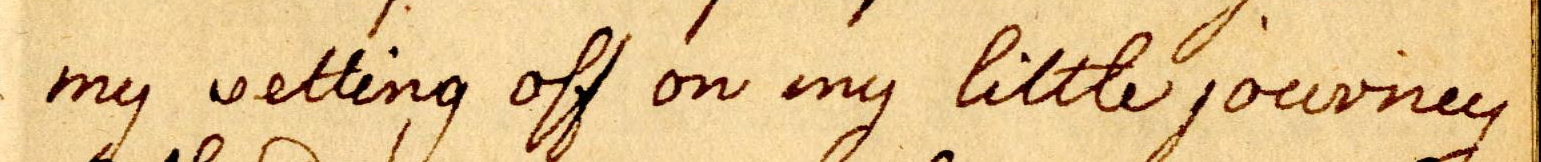my setting off on my little journey
